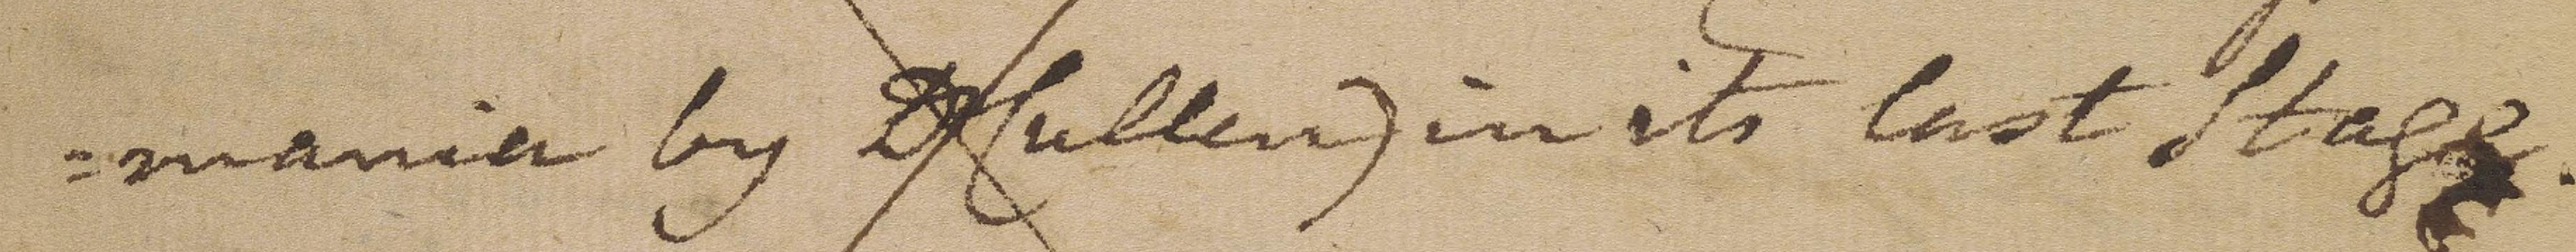-mania by D^r Cullen) in its last Stage.
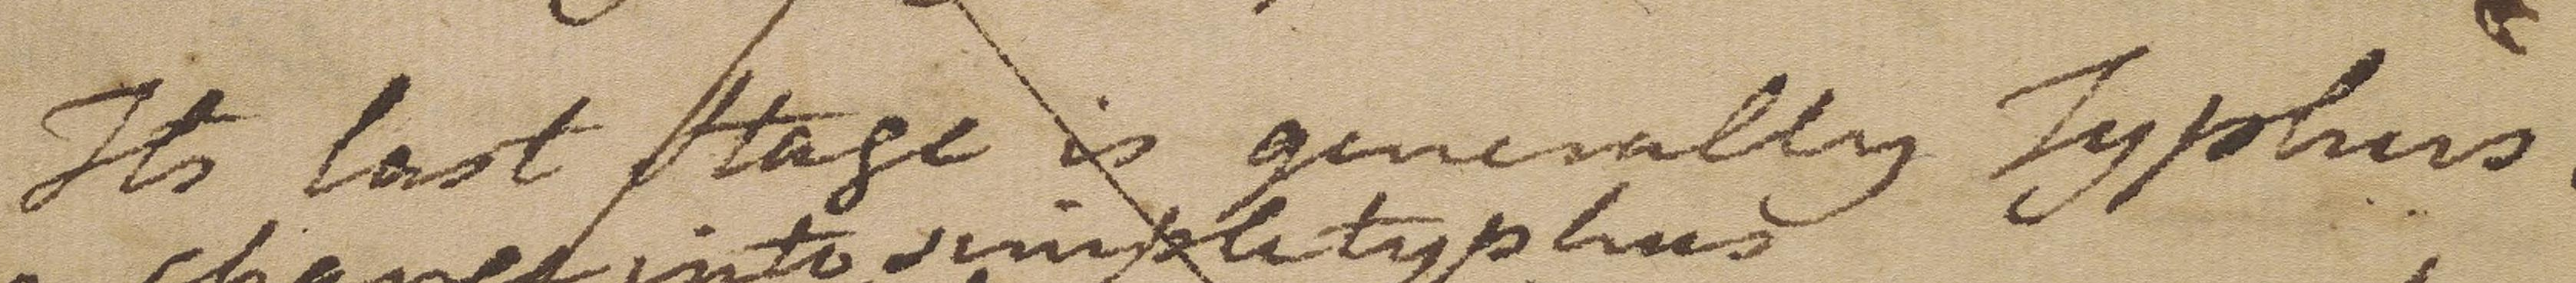The last stage is generally Typhus.
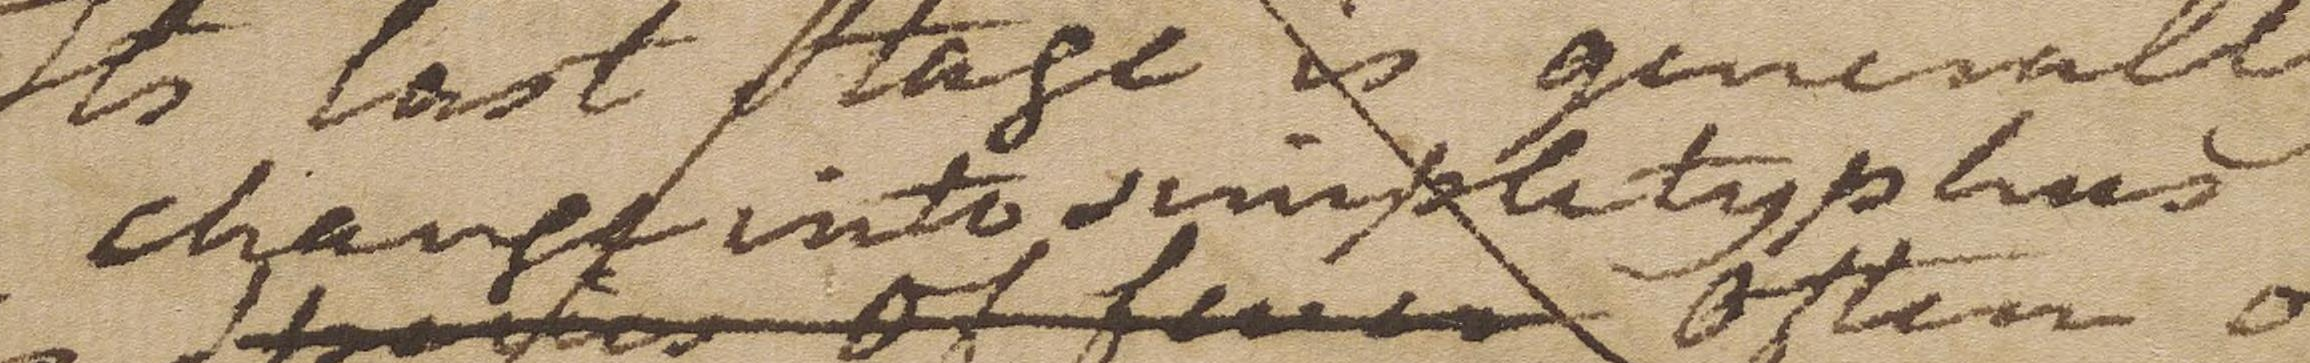changes into simple typhus
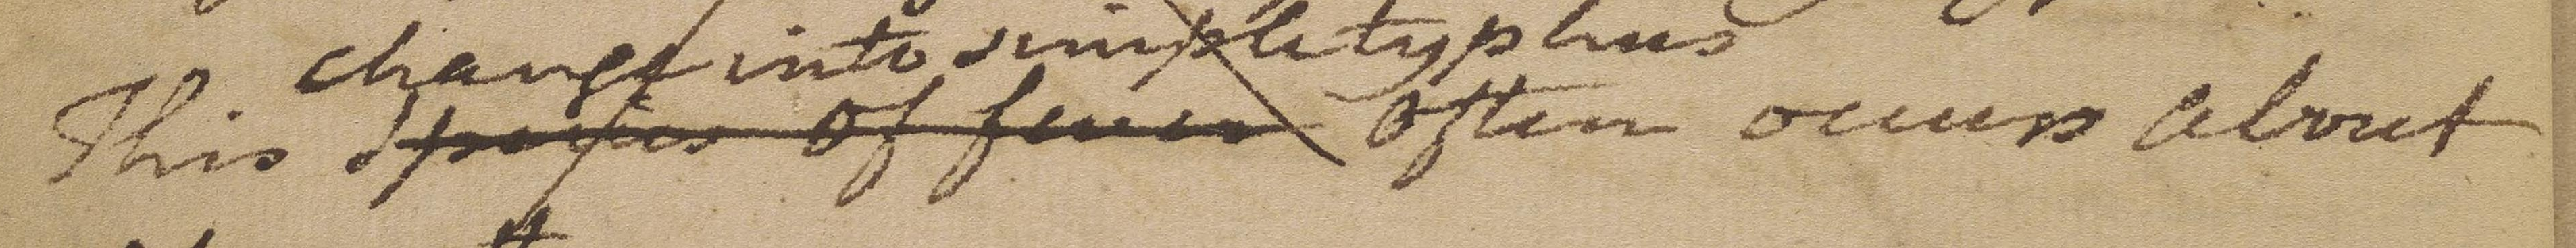This [species of fever] often occurs about
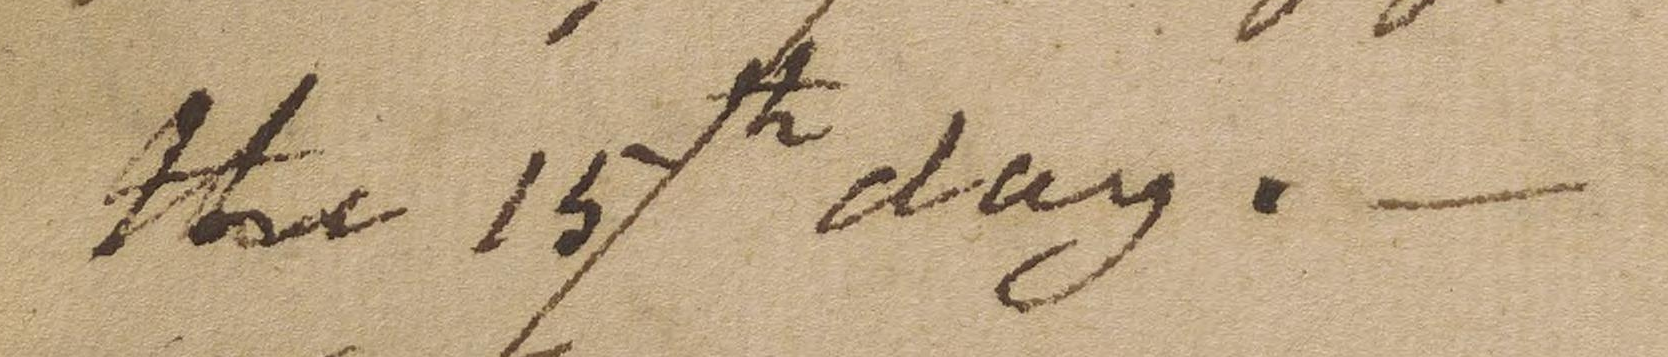the 15^th day.
